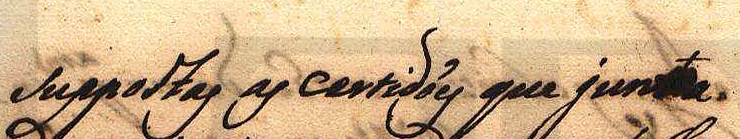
suppostas as certidões que junta.
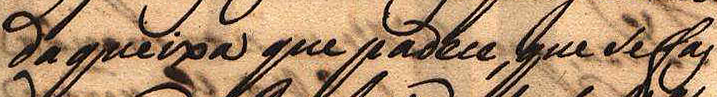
da queixa que padece, que se fas
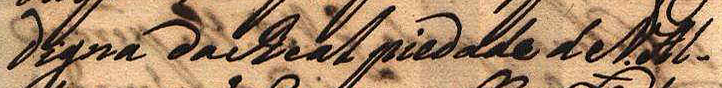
digna da Real piedade de V. Al
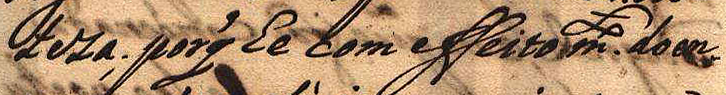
teza; porq̄ he com effeito m.to doen
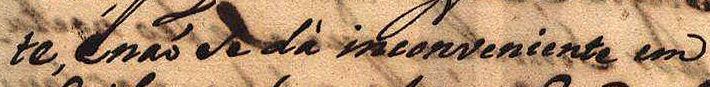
te, e naõ se dá inconveniente en
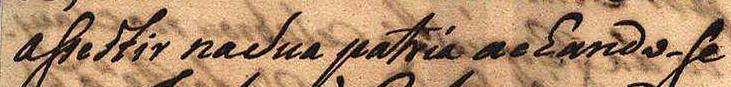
assestir na sua patria achando-se
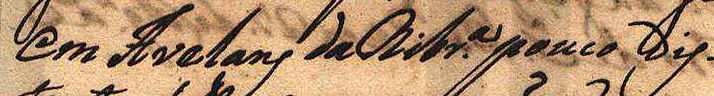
Em Avelans da Ribr.a pouco dis
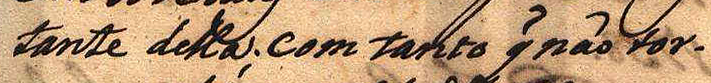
tante della; comtanto q̄ não tor
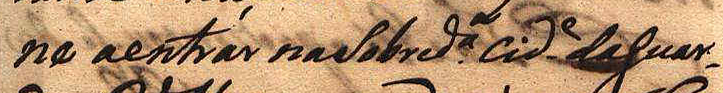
ne a entrar na Sobred.a cid.e da Guar
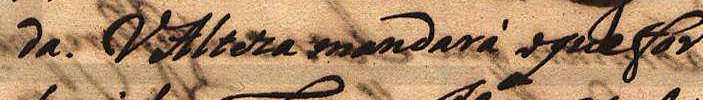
da. V Alteza mandará o que for
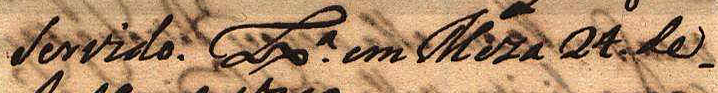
servido. Lx.a em Meza 24. de
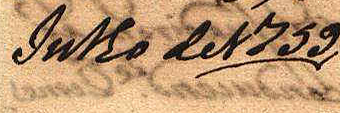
Iulho de 1759
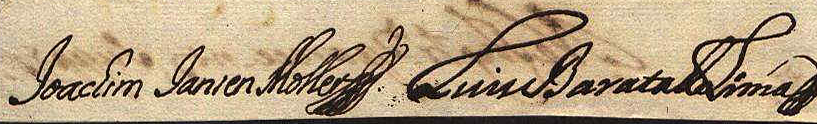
Ioachim Iansen Moller Luiz Barata de Lima
